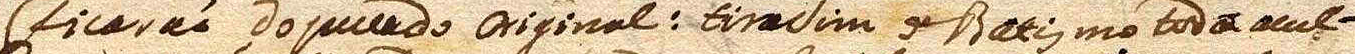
Ficaraõ do peccado original: tira sim o Batismo todo a cul
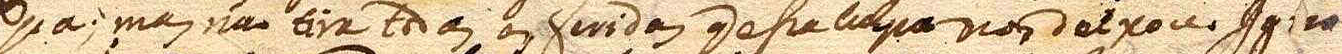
pa; mas não tira todas as feridas q̄ essa culpa nos deixou Jgno
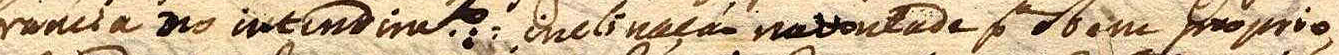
rancia no intendim.to: inclinação na vontade pa o bem proprio,
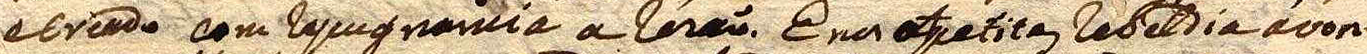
e creado com Repugnancia a Rezaõ. E nos Apetites Rebeldia á von
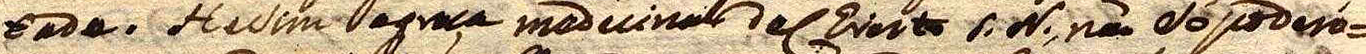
tade. He sim a graça medicinal de Christo s. N., não só poderó
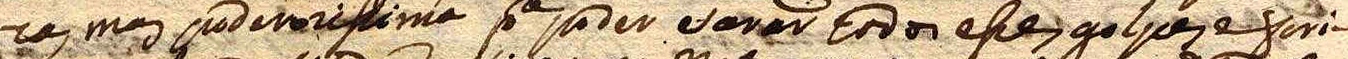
za, mas poderozissima pa poder sarar todos esses golpes e feri
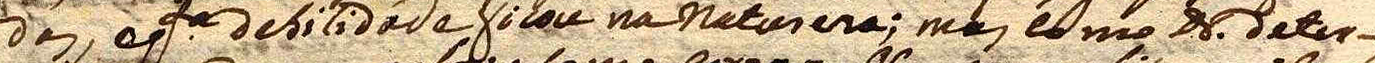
das, e q.ta debilidade ficou na Natureza; mas como Ds. deter
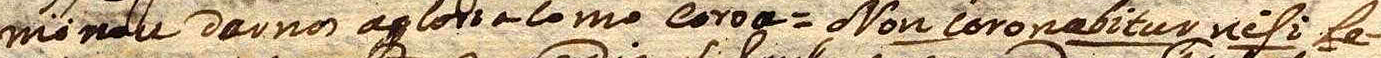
minou darnos a gloria como coroa = Non coronabitur nisi Le
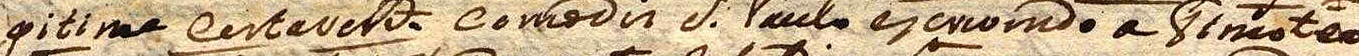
gitima certaverit como dis S. Paulo escrevendo a Timoteo
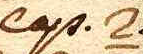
cap.2.
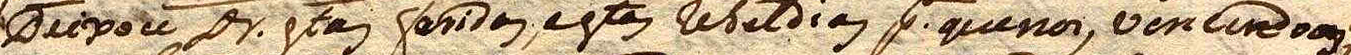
Deixou Ds. estas feridas, estas Rebeldias p.a que nos, vencendo as
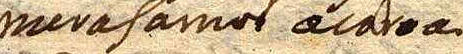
merasamos a coroa
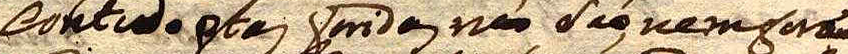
Contudo estas feridas não saõ, nem serão
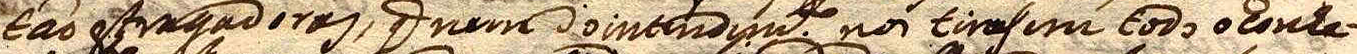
tão estragadoras, q̄ nem do intendim.to nos tirasem todo o conhe
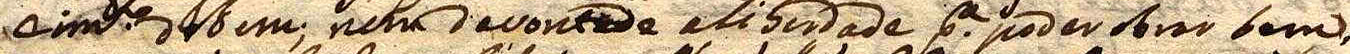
cim.to do bem; nem da vontade e Liberdade p.a poder obrar bem;
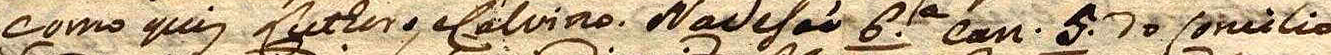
como quis Luthero e Calvino; Na sesaõ 6.a can. 5. do Concilio
